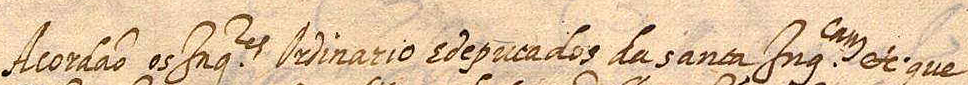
Acordaõ os Jnq.res Ordinario E deputados da santa Jnq.çam &c. que
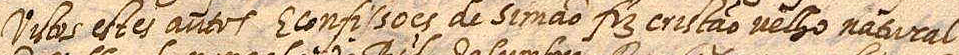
Vistos estes autos E confissoes de Simão frz̄ cristão uelho natural
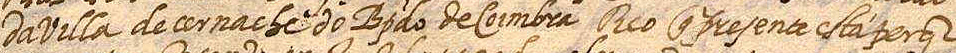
da Villa de cernache do Bp̄do de Coimbra Reo q̄ presente está porq̄
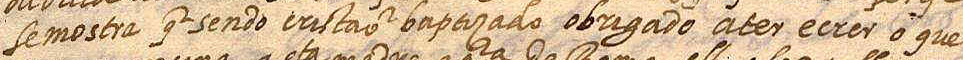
se mostra q̄ sendo cristaõ baptizado obrigado a ter e crer o que
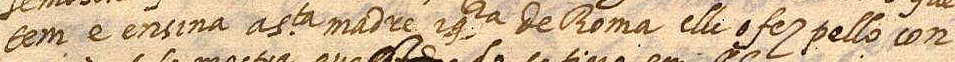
tem e ensina a s.ta madre ig.ra de Roma elle o fez pello con
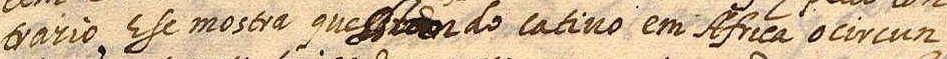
trario, E se mostra que estando catiuo em Africa o circun
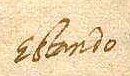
Estando
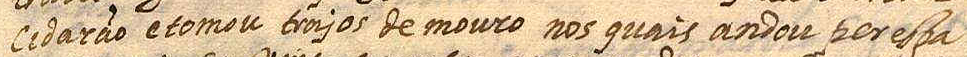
cidarão e tomou trajos de mouro nos quais andou per espa
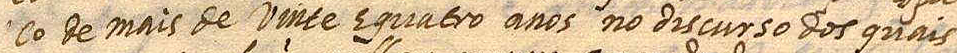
ço de mais de vinte E quatro anos no discurso dos quais
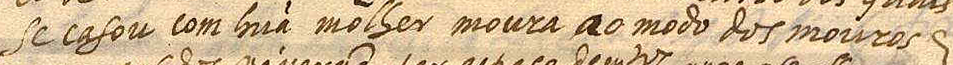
se casou com huā molher moura ao modo dos mouros E
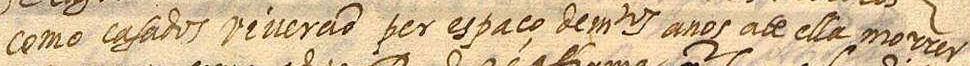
como casados viuerão per espaço de mtos anos ate ella morrer
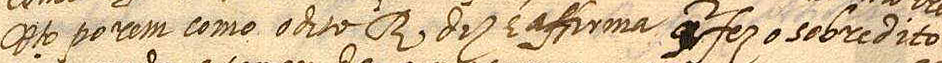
V.to porem como o dito R. diz E affirma q̄ fez o sobredito
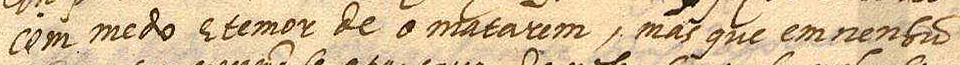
com medo E temor de o matarem, mas que em nenhū
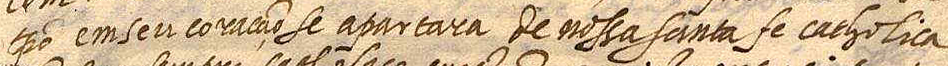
tpō em seu coraçaõ se apartara de nossa santa fe catholica
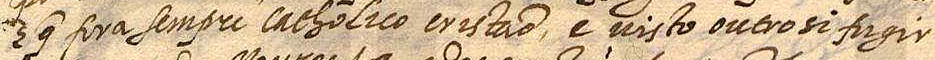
E q̄ fora sempre catholico cristaõ, e uisto outrosi fugir
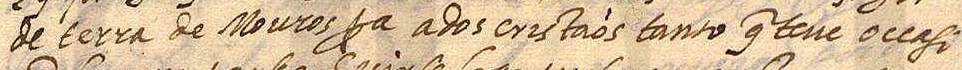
de terra de Mouros ꝑa a dos cristaõs tanto q̄ teue occasi
